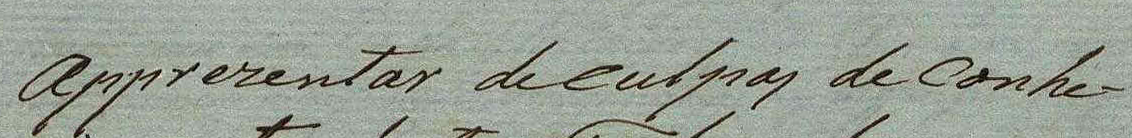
apprezentar de culpas de conhe
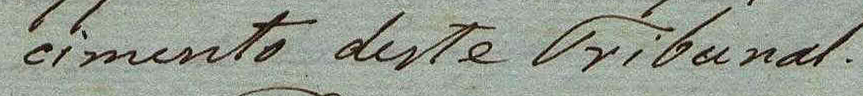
cimento deste Tribunal.
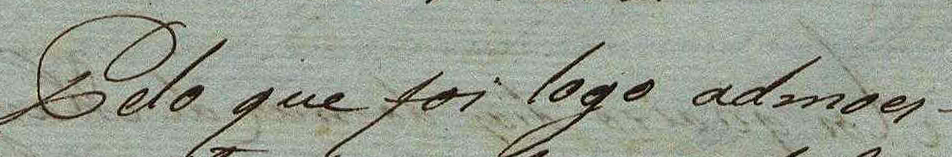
Pelo que foi logo admoes
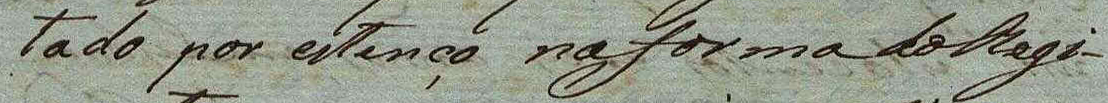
tado por estenço na forma do Regi
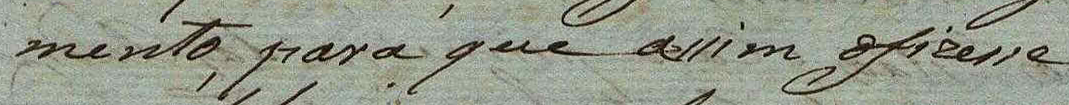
mento, para que assim o fizesse
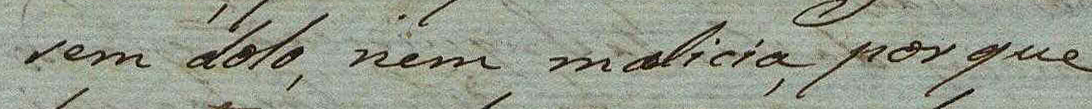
sem dolo, nem malicia, porque
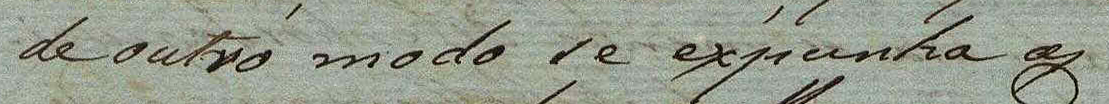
de outro modo se expunha as
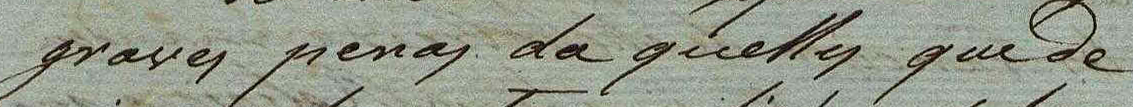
graves penas daquelles que de
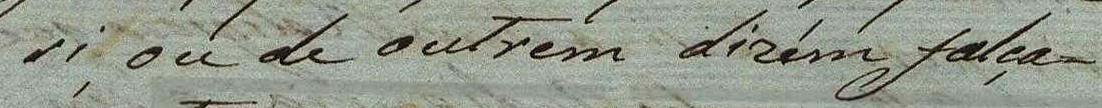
si, ou de outrem dizém falça
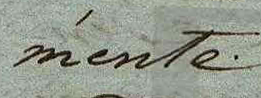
mente.
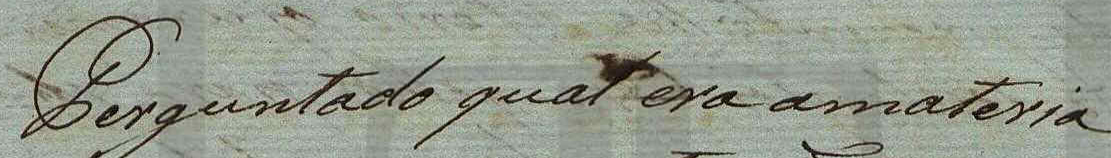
Perguntado qual era a materia
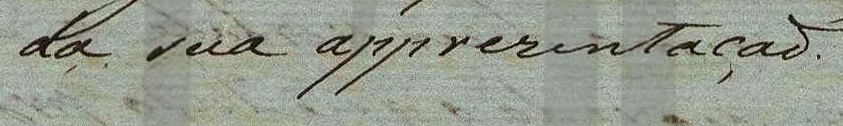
da sua apprezentaçaõ.
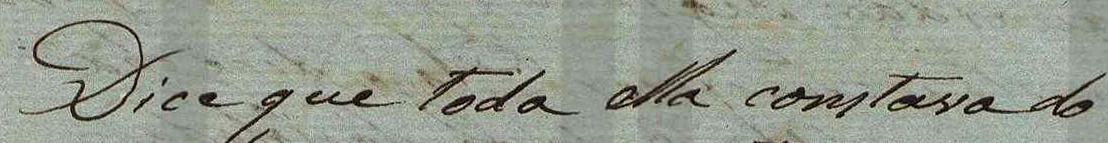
Dice que toda ella constava do
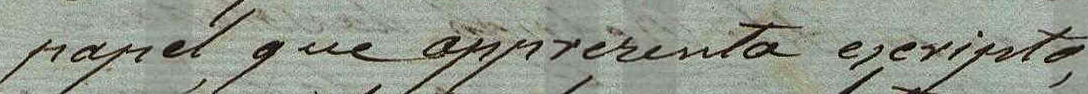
papel, que apprezenta escripto,
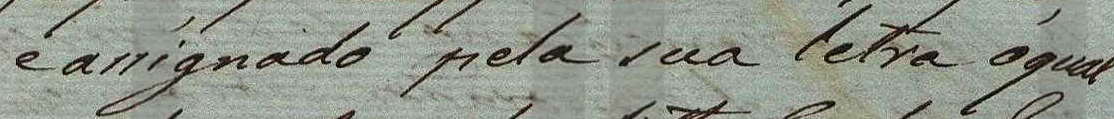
e assignado pela sua letra o qual
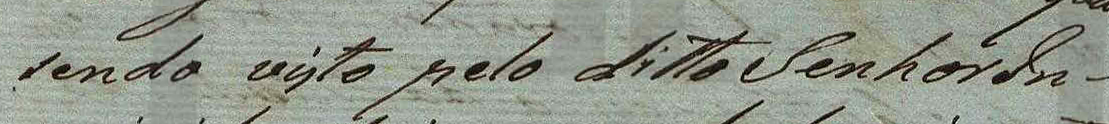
sendo visto pelo ditto Senhor In
